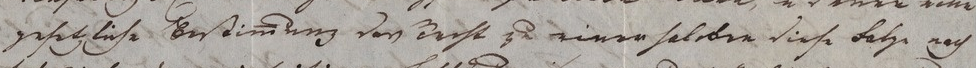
gesetzliche Bestimmung das Recht zu einer solchen diese Folge nach
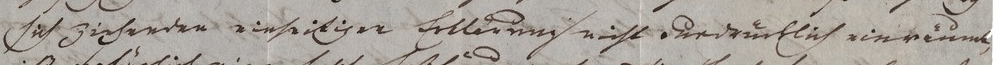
sich ziehenden einseitigen Erklärung nicht ausdrücklich einräumt,
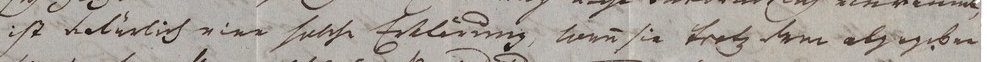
ist natürlich eine solche Erklärung, wenn sie trotzdem abgegeben
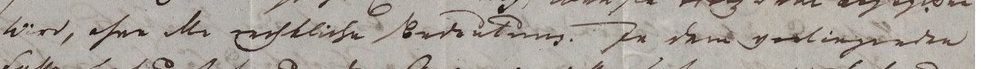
wird, ohne alle rechtliche Bedeutung. In dem vorliegenden
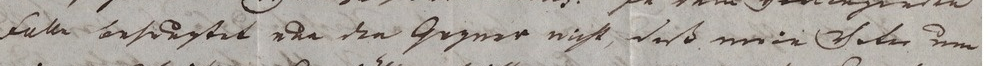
Falle behauptet nun den Gegener nicht, daß mein Vater um
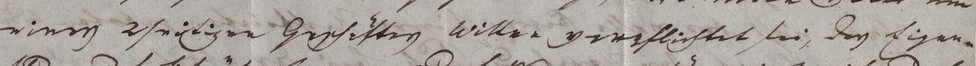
eines 2 seitigen Geschäftes Willen verpflichtet sei, das Eigen-
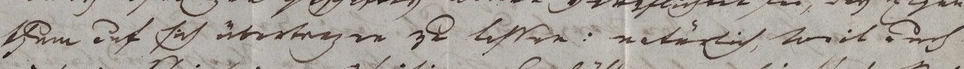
thum auf sich übertragen zu lassen: natürlich, weil auch
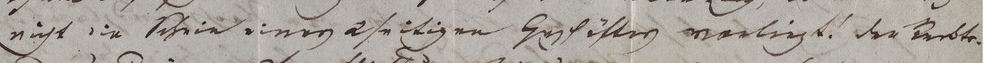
nicht ein Schein eines 2 seitigen Geschäftes vorliegt! Der Rechts-
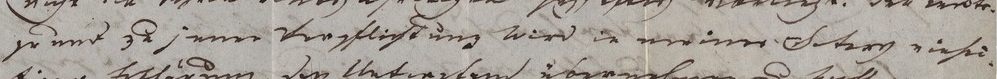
grund zu jener Verpflichtung wird in meines Vaters einsei-
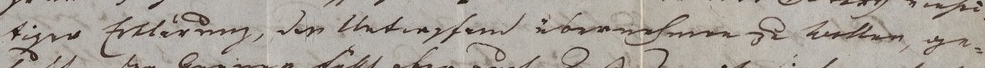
tiger Erklärung, das Unterpfand übernehmen zu wollen, ge-
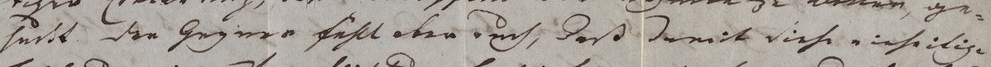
sucht Der Gegner fühlt aber auch, daß damit diese einseitige
